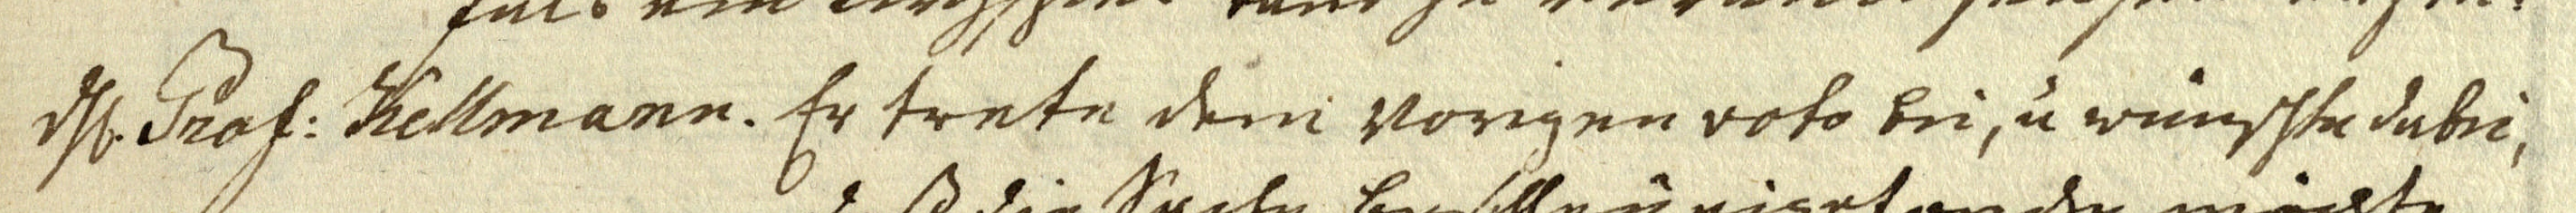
dh. Prof. Kellmann. Er trete dem vorigen voto bei, u wünschte dabei,
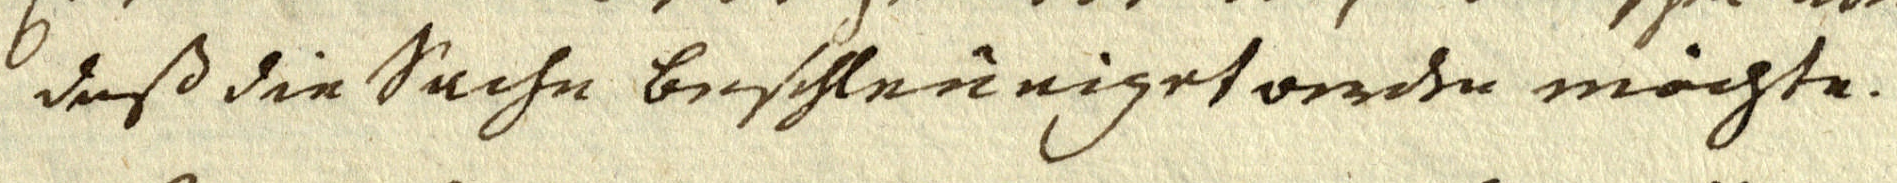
daß die Sache beschleuniget worden mögte.
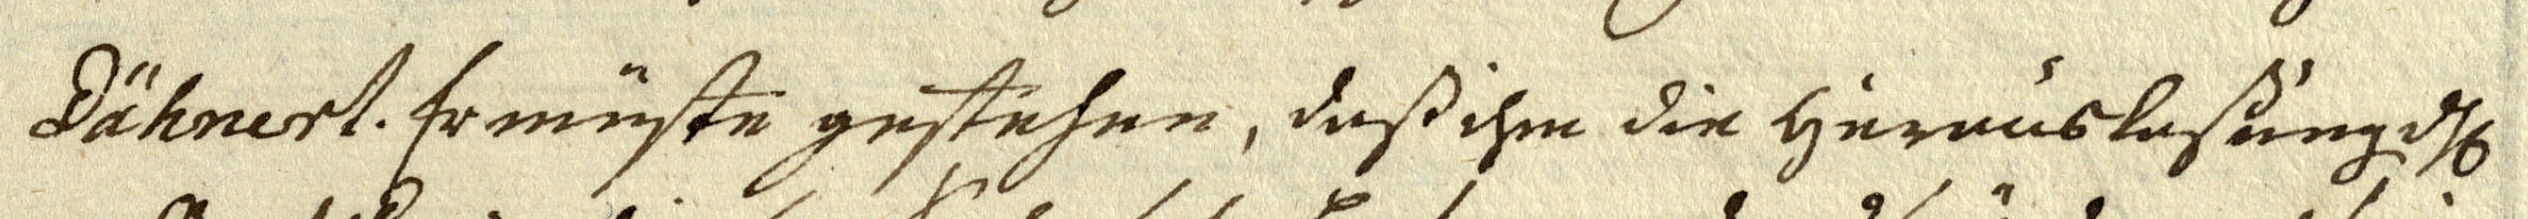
Dähnert. Er müßte gestehen, daß ihm die Herauslaßung dh
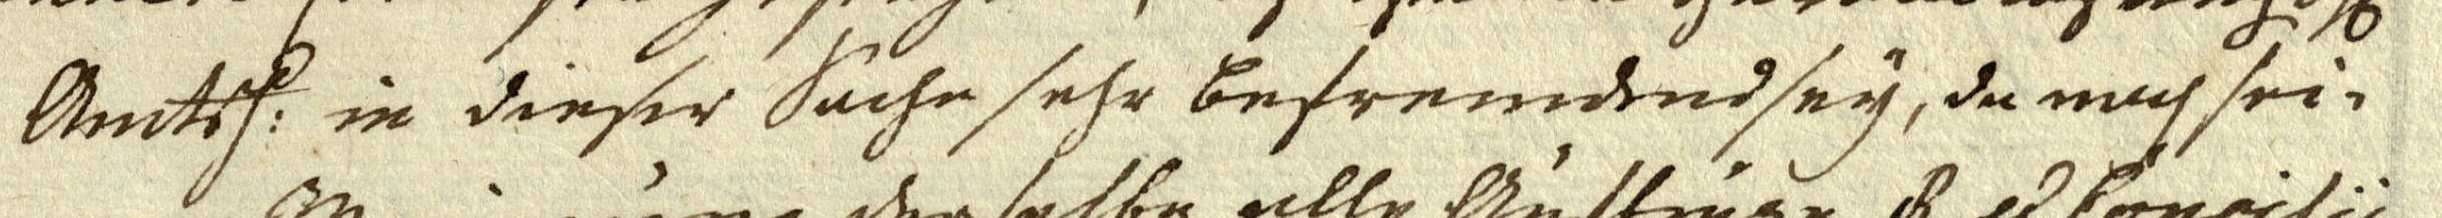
Amtsh. in dieser Sache sehr befremdend seÿ, da nach sei¬
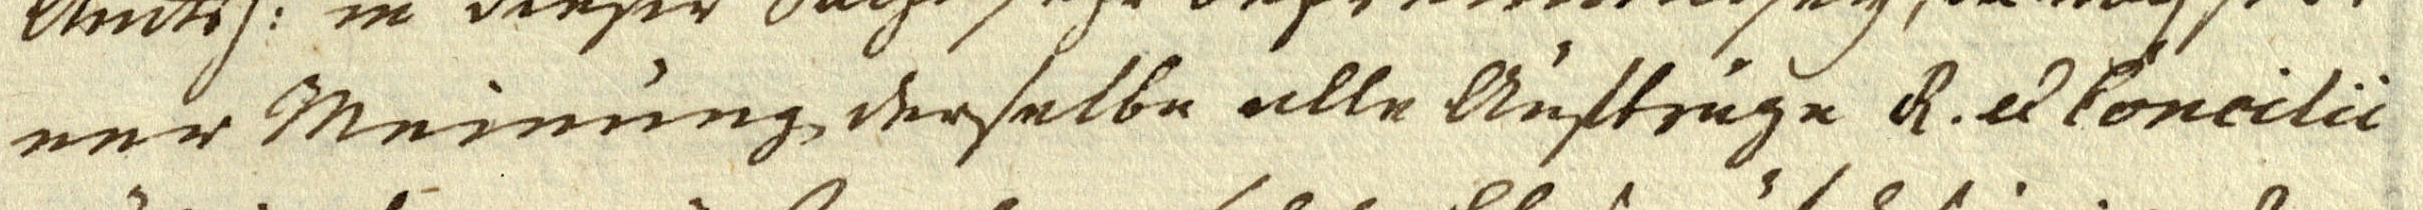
ner Meinung, derselbe alle Aufträge R. et Concilii
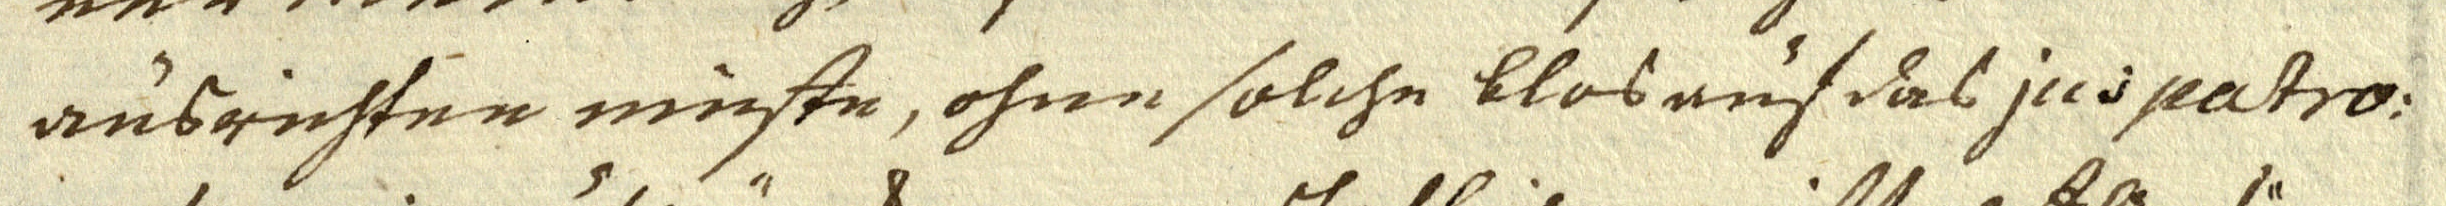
ausrichten müßte, ohne solche blos auf das jus patro¬
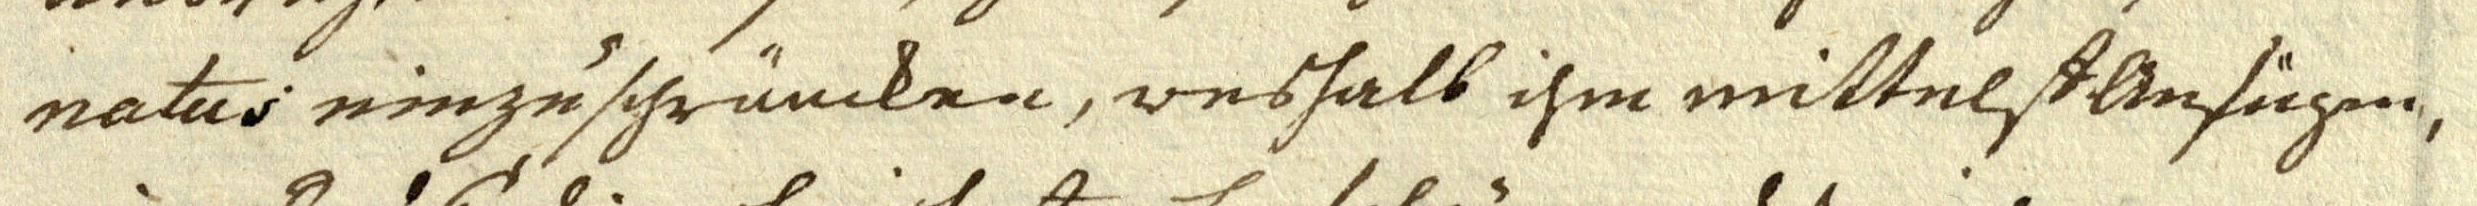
natus einzuschräncken, weshalb ihm mittelst Anfügen,
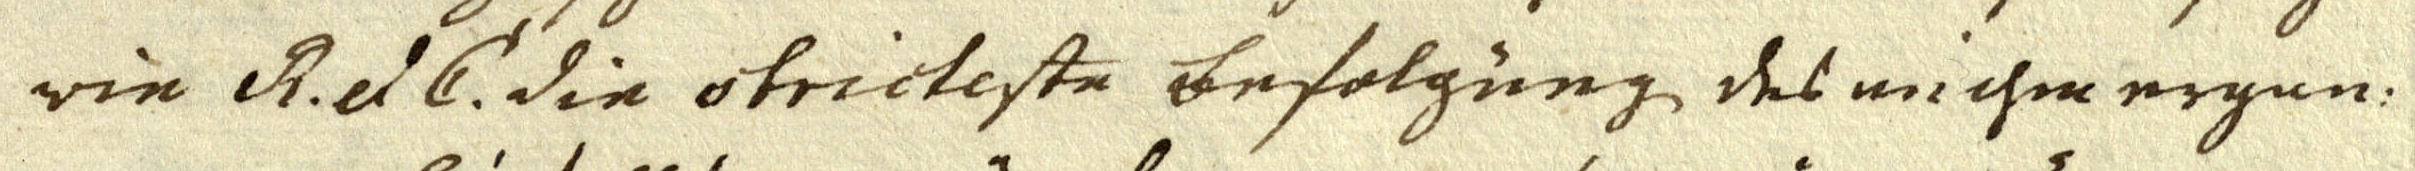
wie R. et C. die stricteste Befolgung des an ihm ergan¬
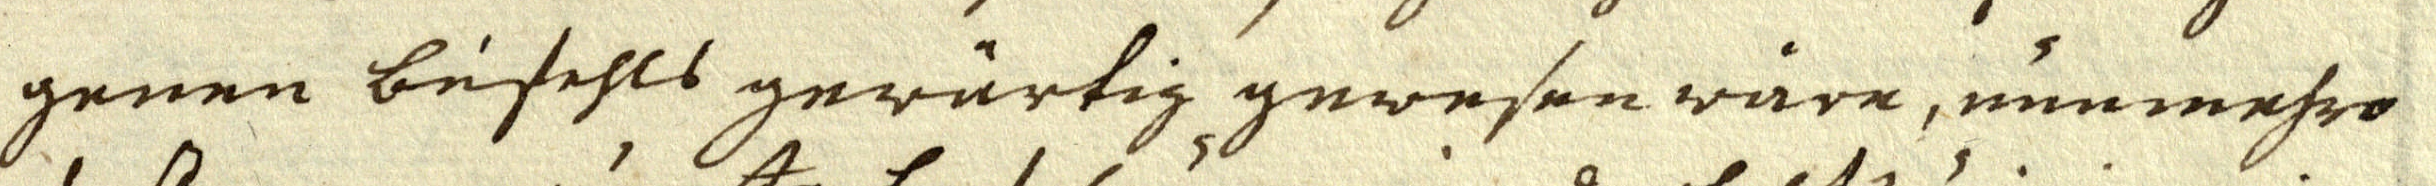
genen Befehls gewärtig gewesen wäre, nunmehro
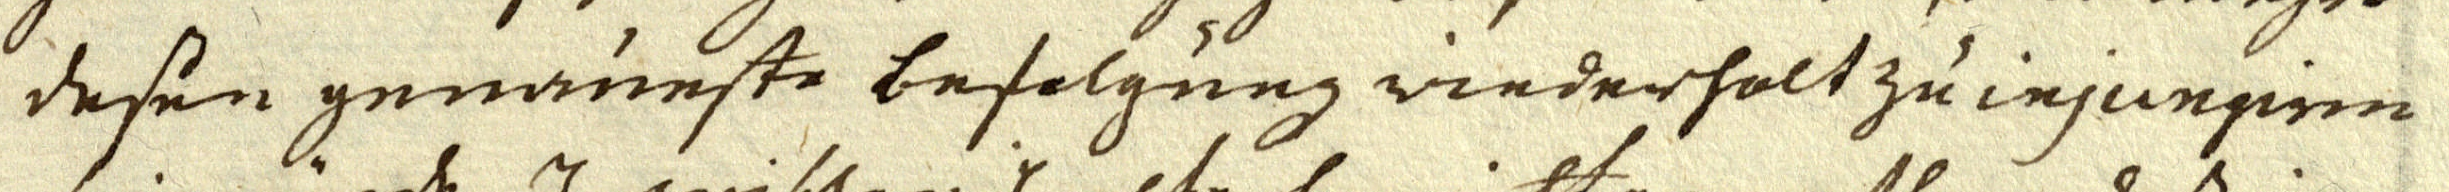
deßen genaueste Befolgung wiederholt zu injungiren
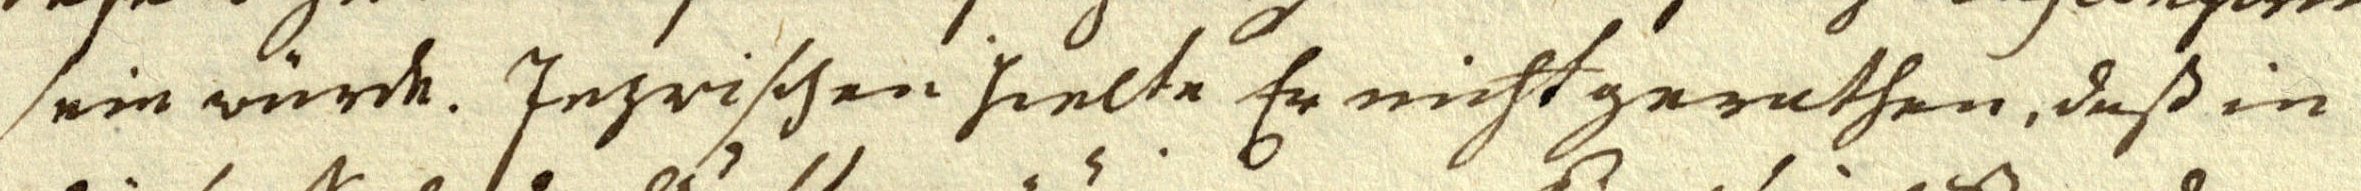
sein würde. Inzwischen hielte Er nicht gerathen, daß in
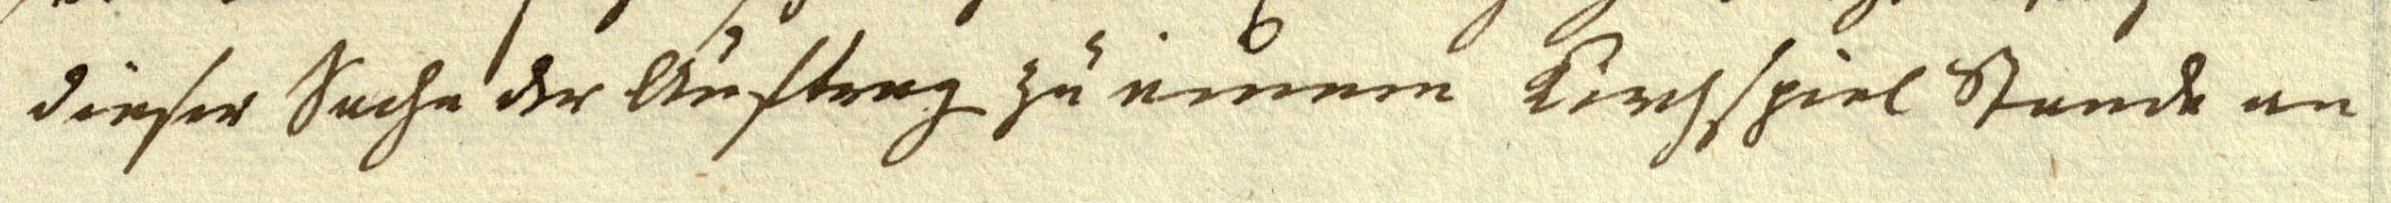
dieser Sache der Auftrag zu einem Kirchspiel Stande an
